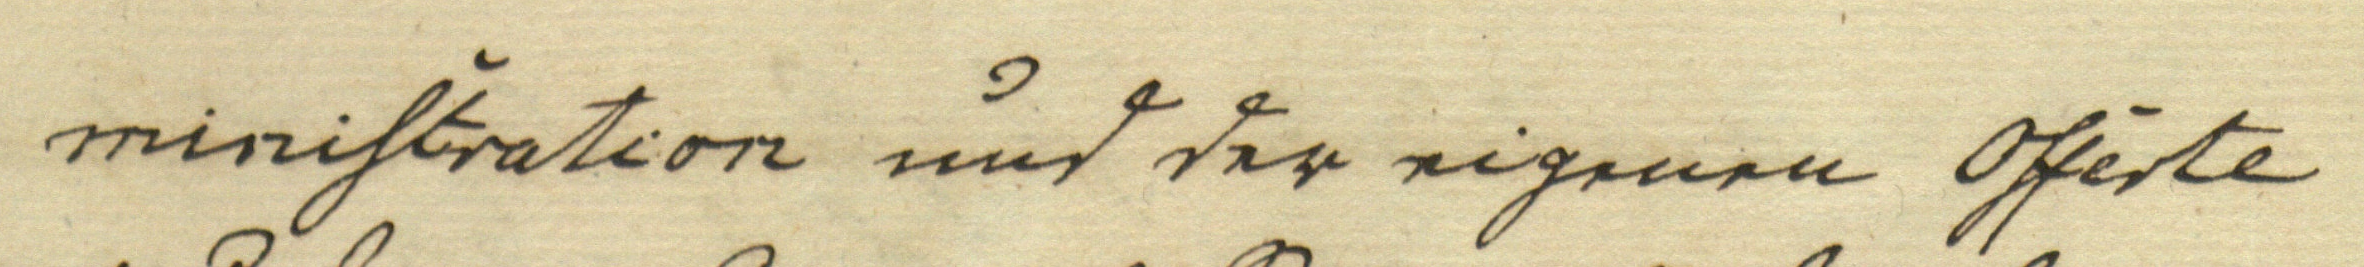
ministration und der eigenen Offerte
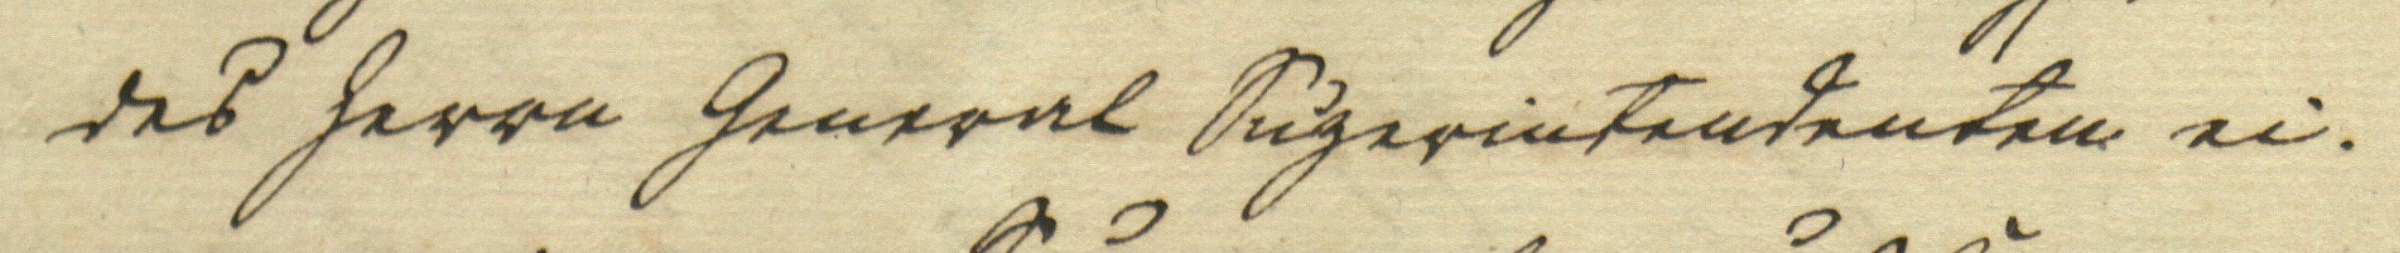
des Herrn General Superintendenten ei¬
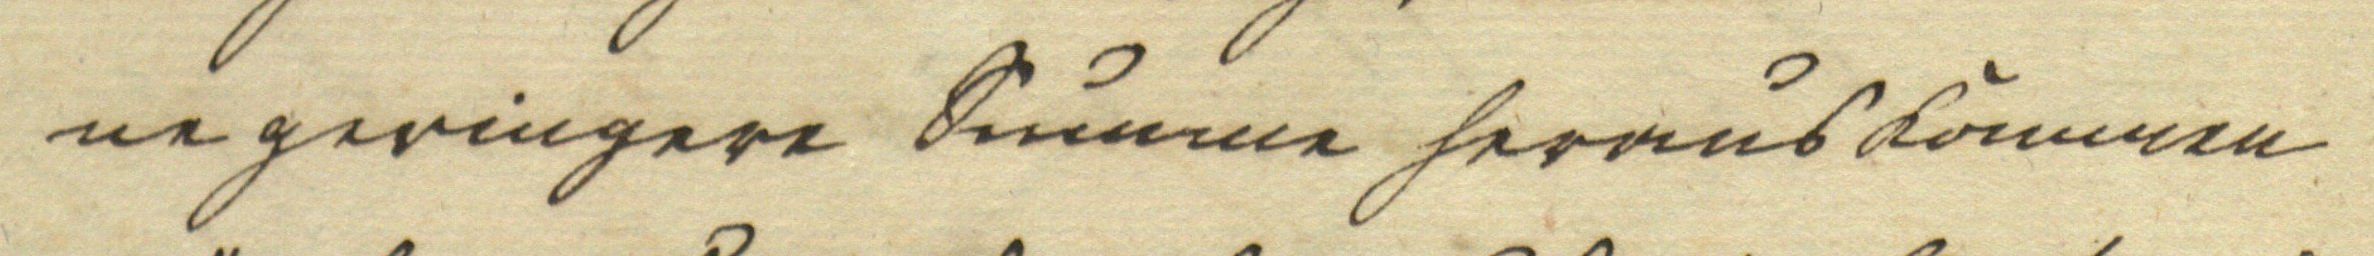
ne geringere Summe herauskommen
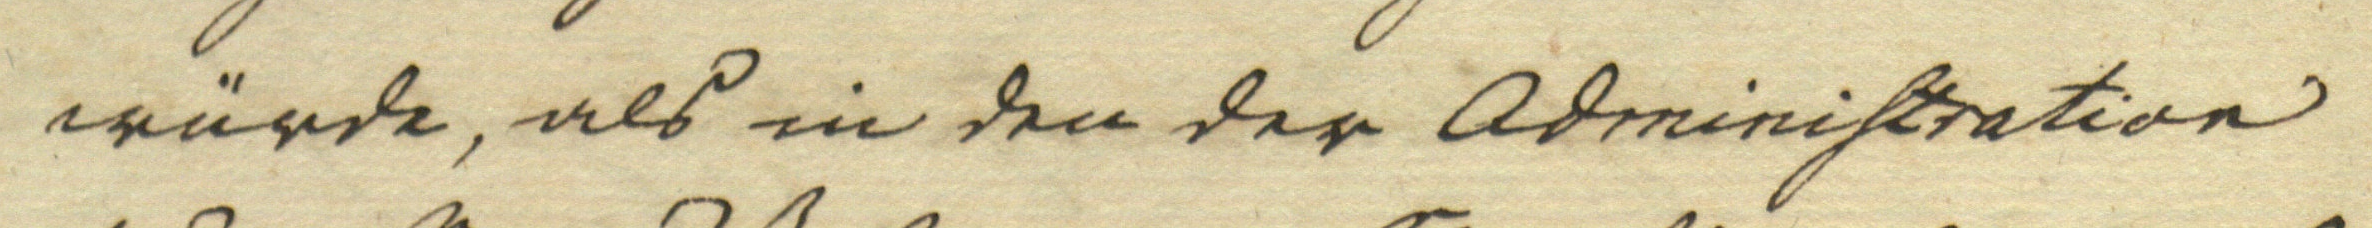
würde, als in den der Administration
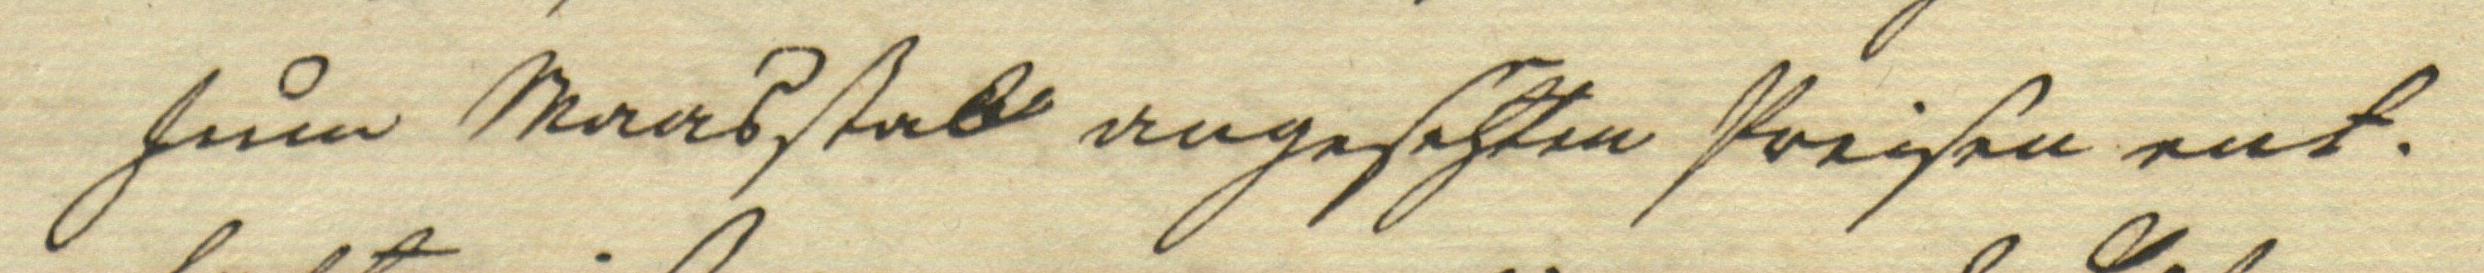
zum Maasstab angesetzten Preisen ent¬
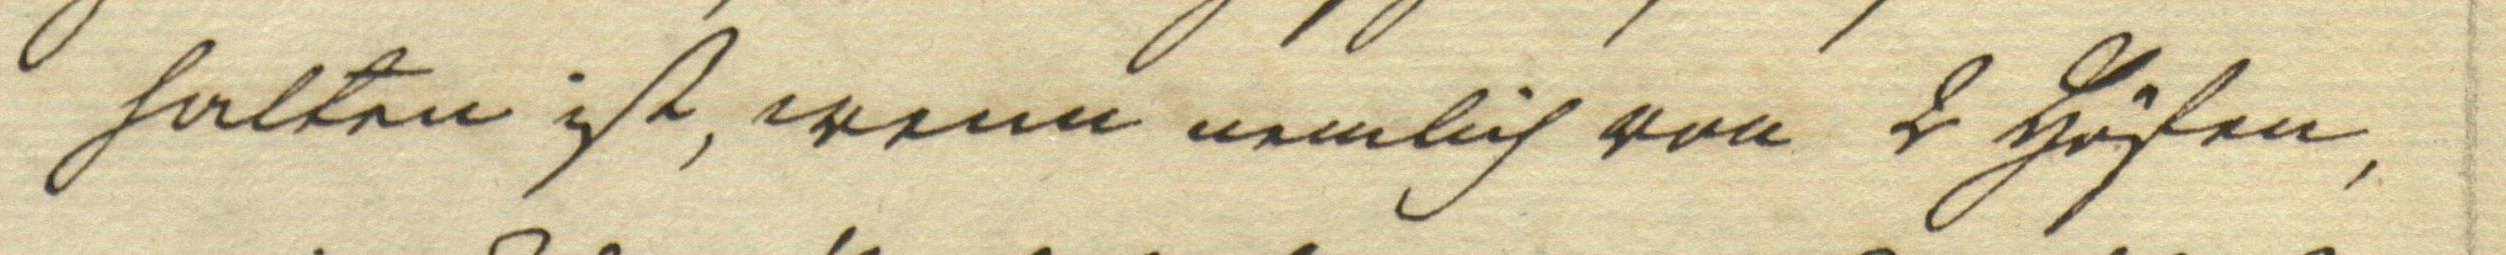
halten ist, wenn nemlich von 2 Höfen,
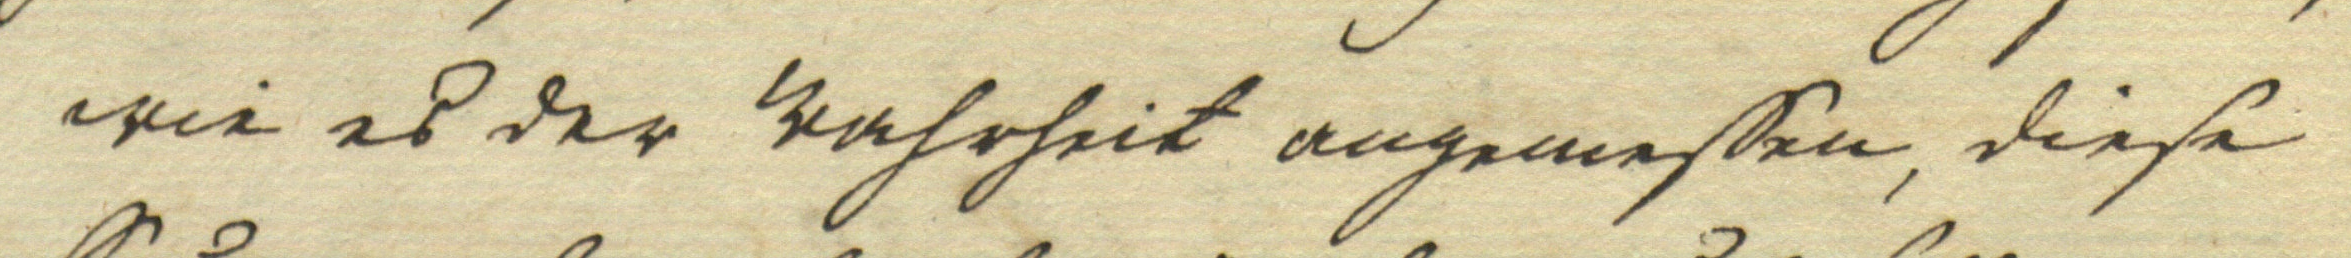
wie es der Wahrheit angemessen, diese
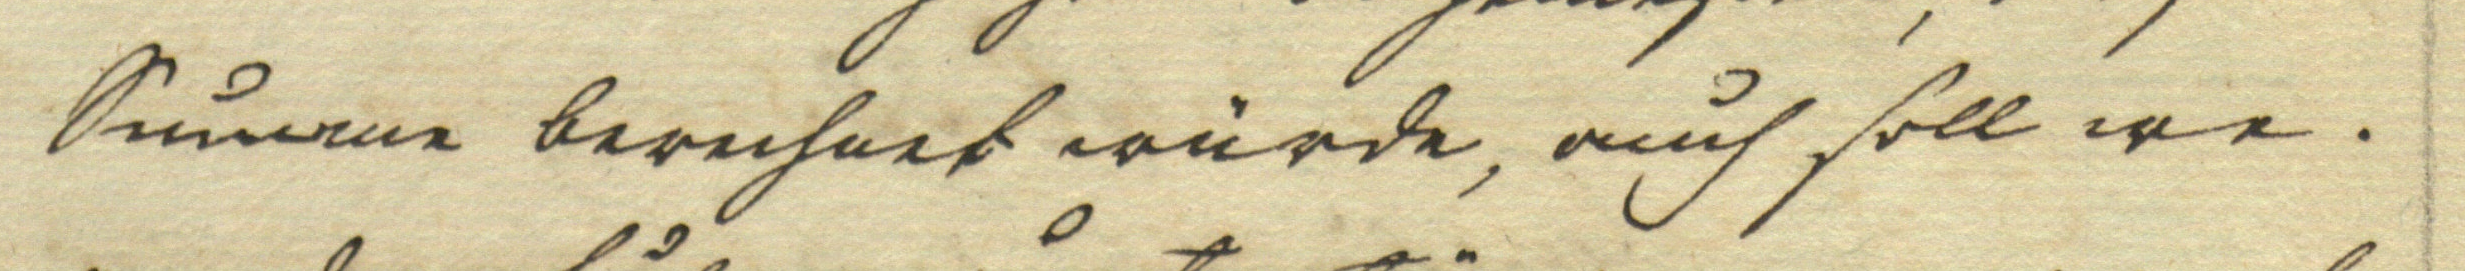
Summe berechnet würde, auch soll we¬
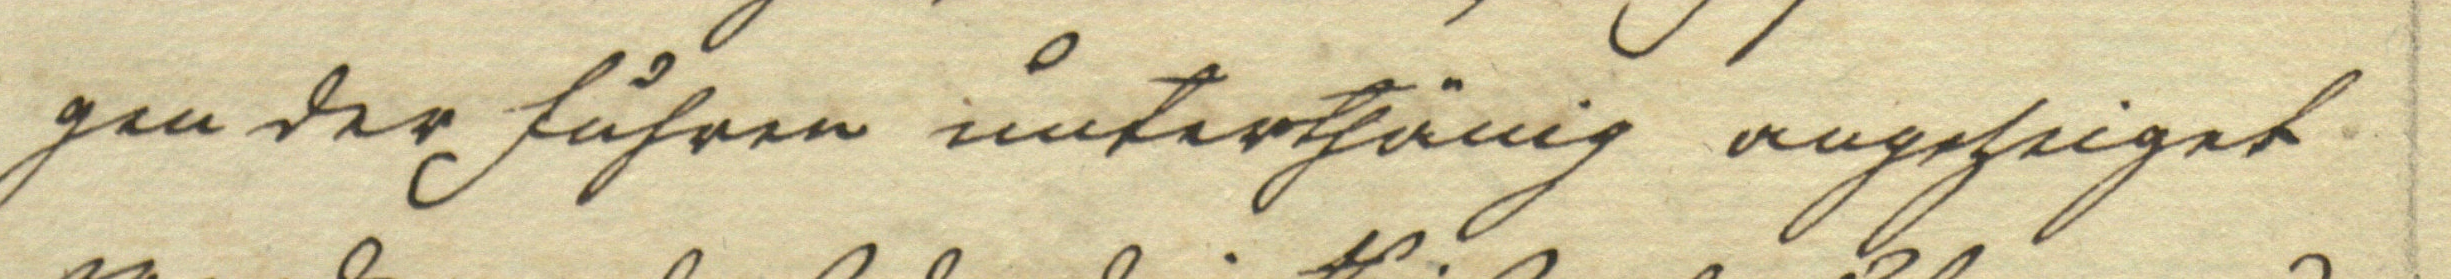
gen der Fuhren unterthänig angezeiget
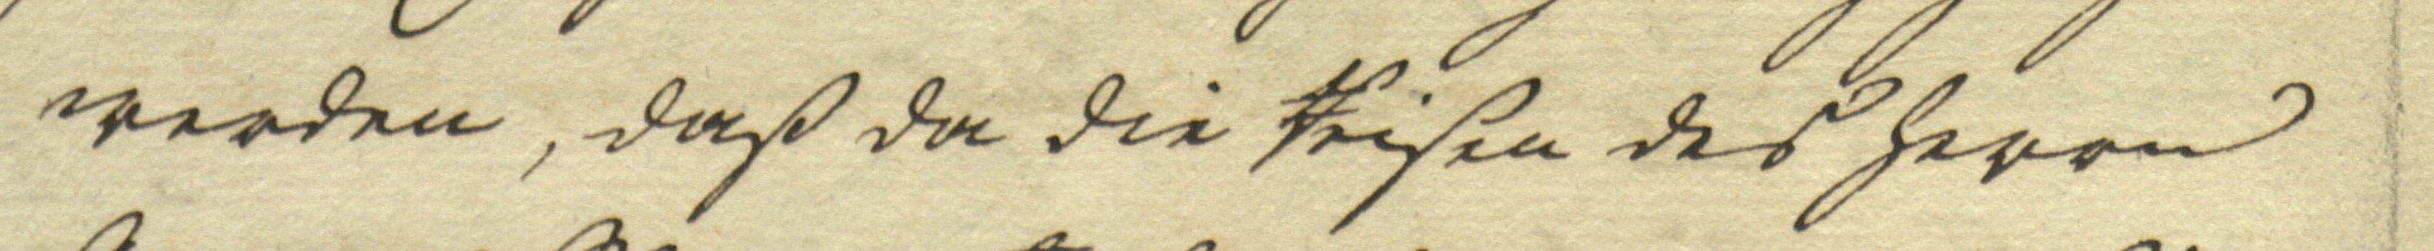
werden, daß da die Reisen des Herrn
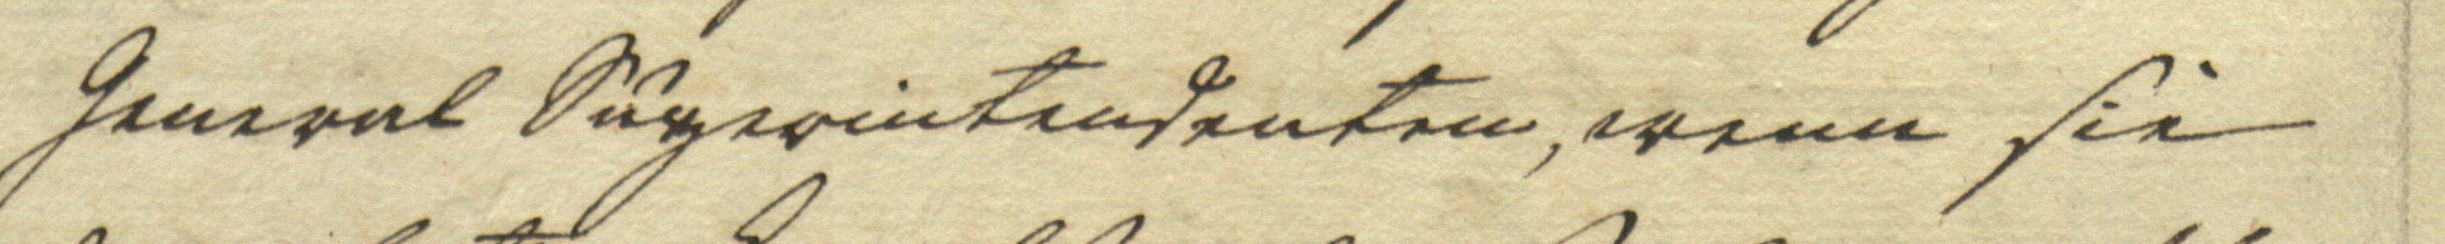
General Superintendenten, wenn sie
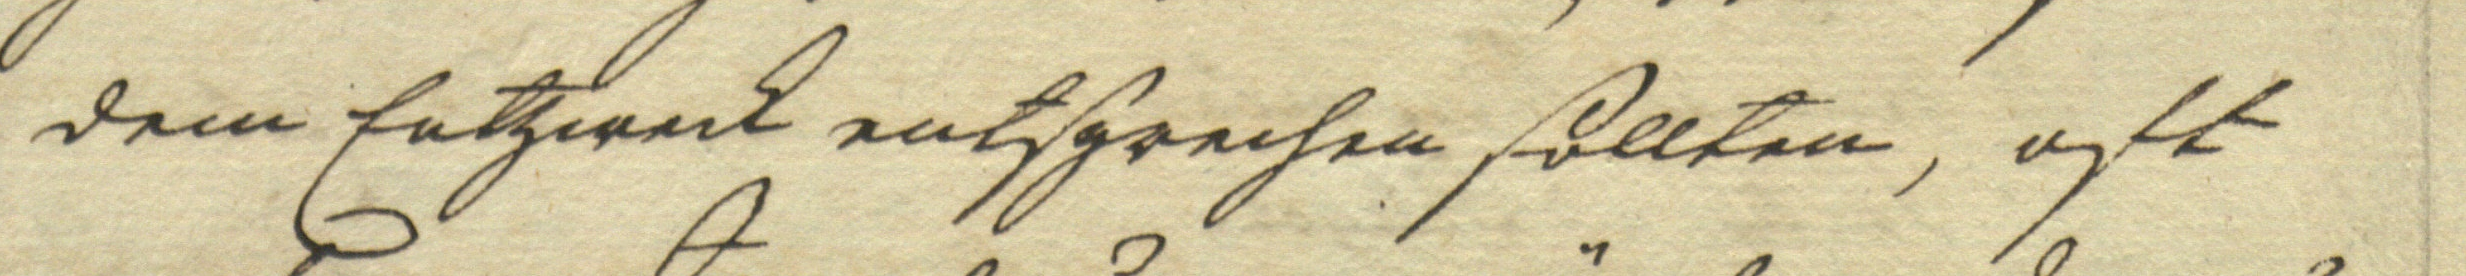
dem Entzweck entsprechen sollten, oft
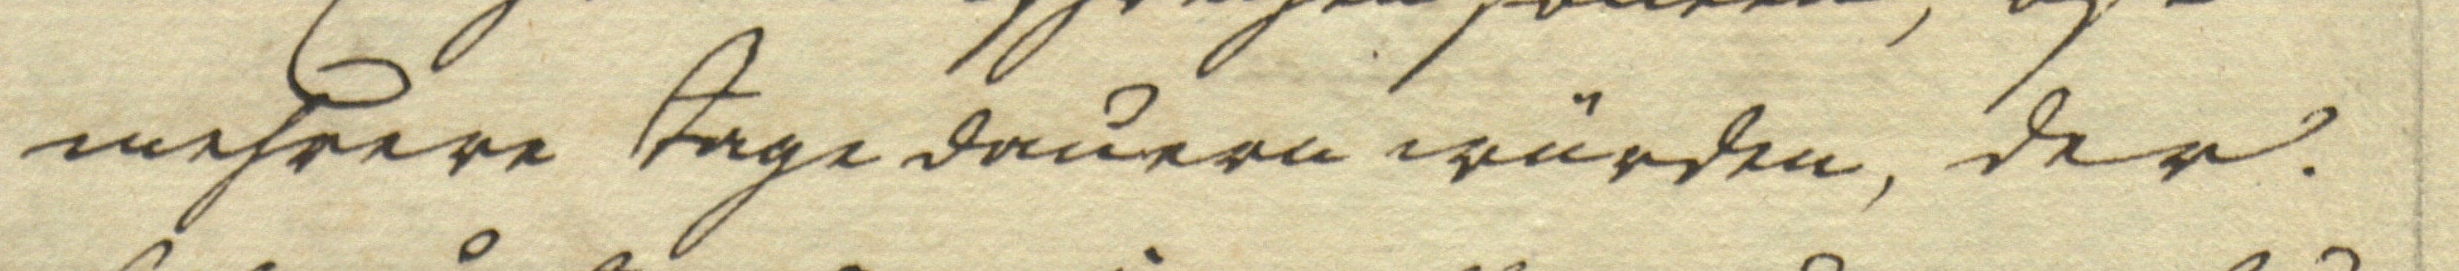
mehrere Tage dauern würden, der¬
